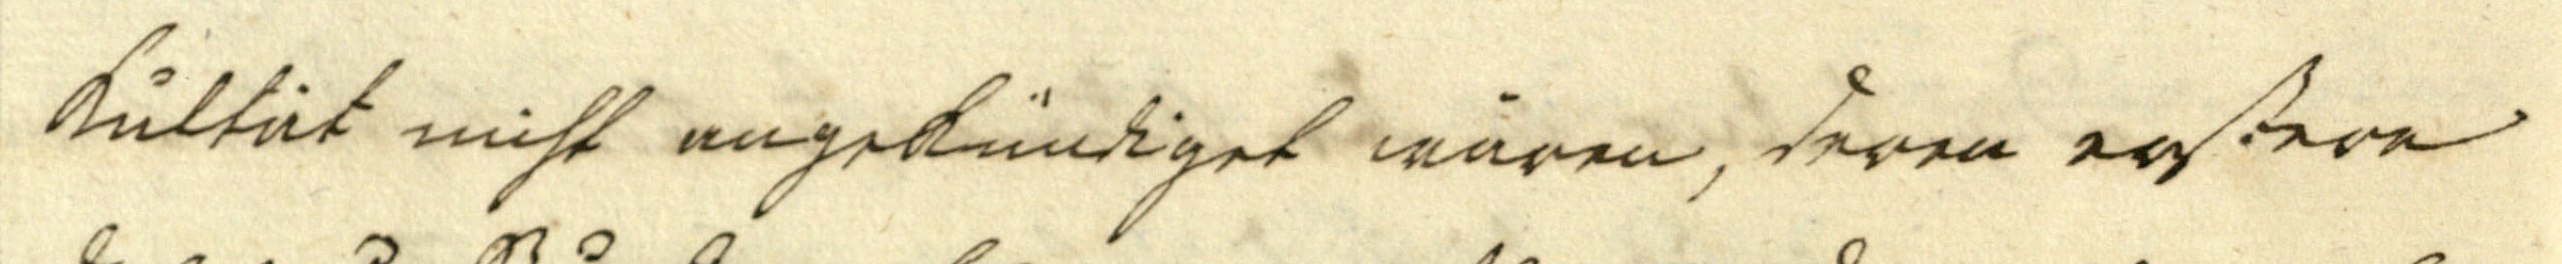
kultät nicht angekündiget wären, deren erstere
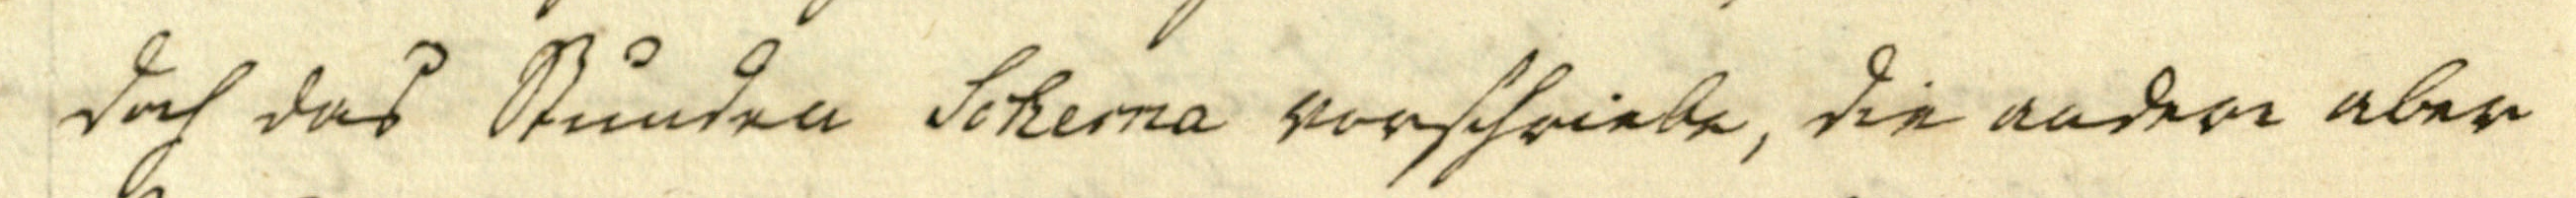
doch das Stunden Schema vorschriebe, die andere aber
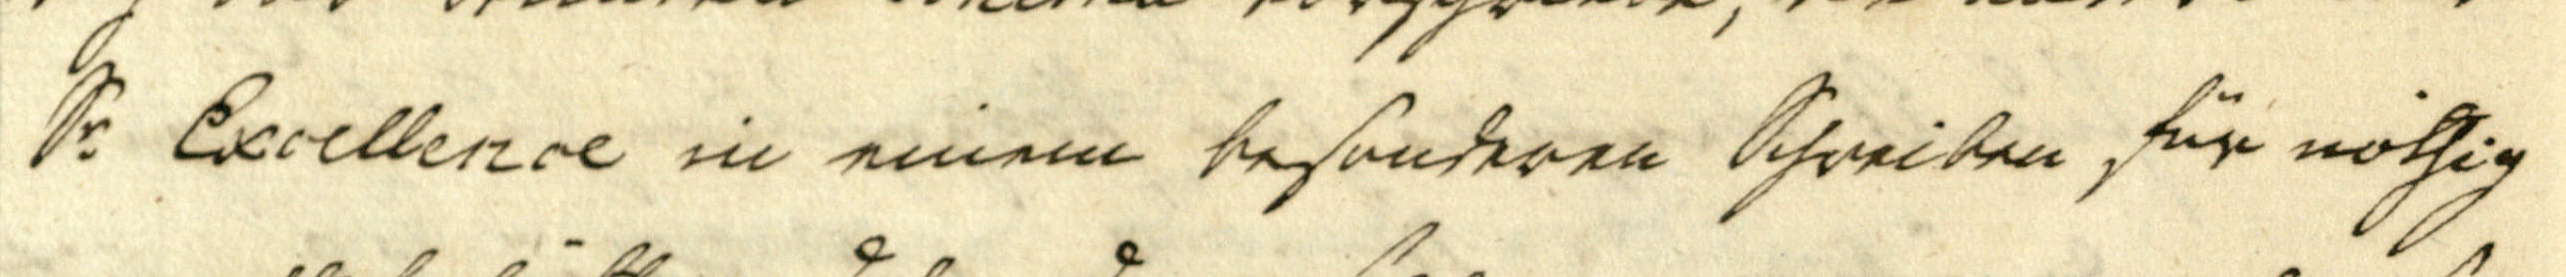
Sr. Excellence in einem besonderen Schreiben für nöthig
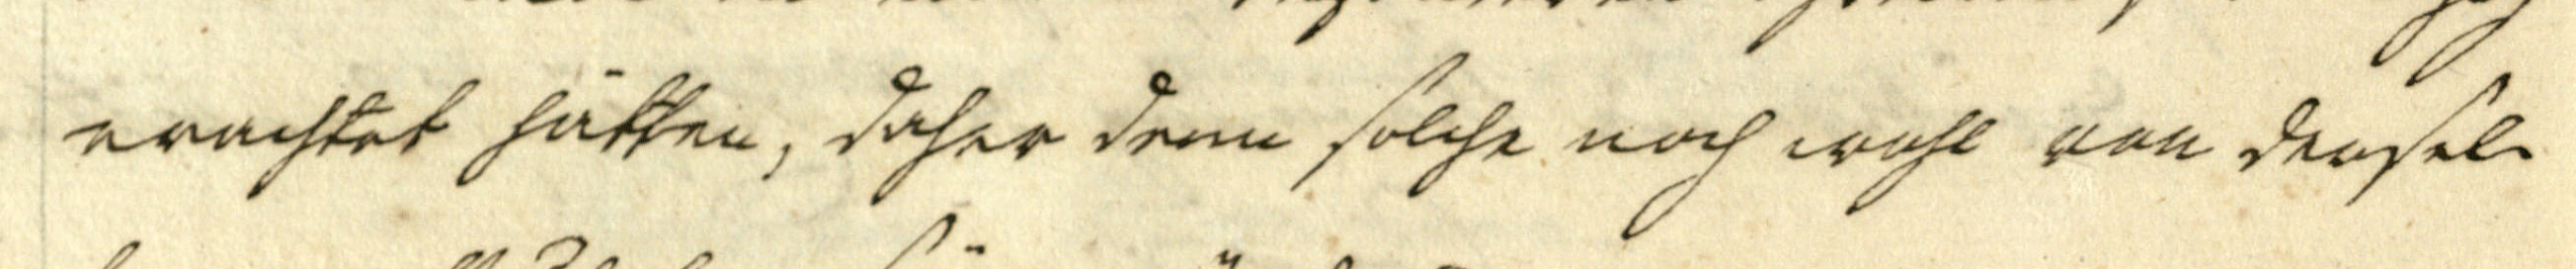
erachtet hätten, daher denn solche noch wohl von dersel¬
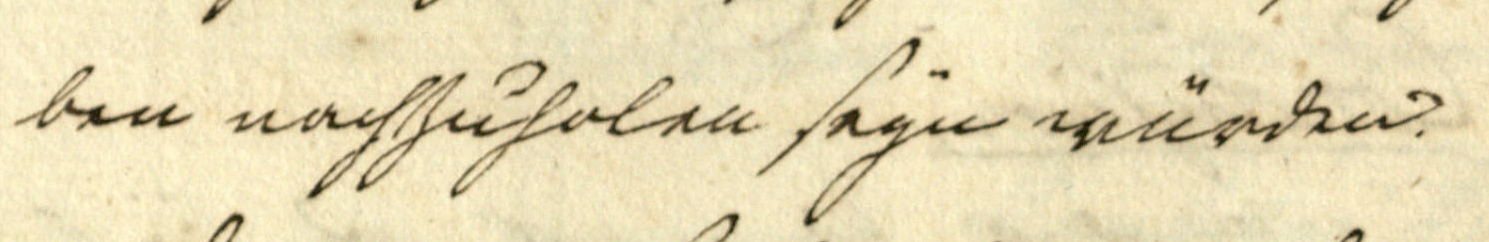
ben nachzuholen seÿn würden.
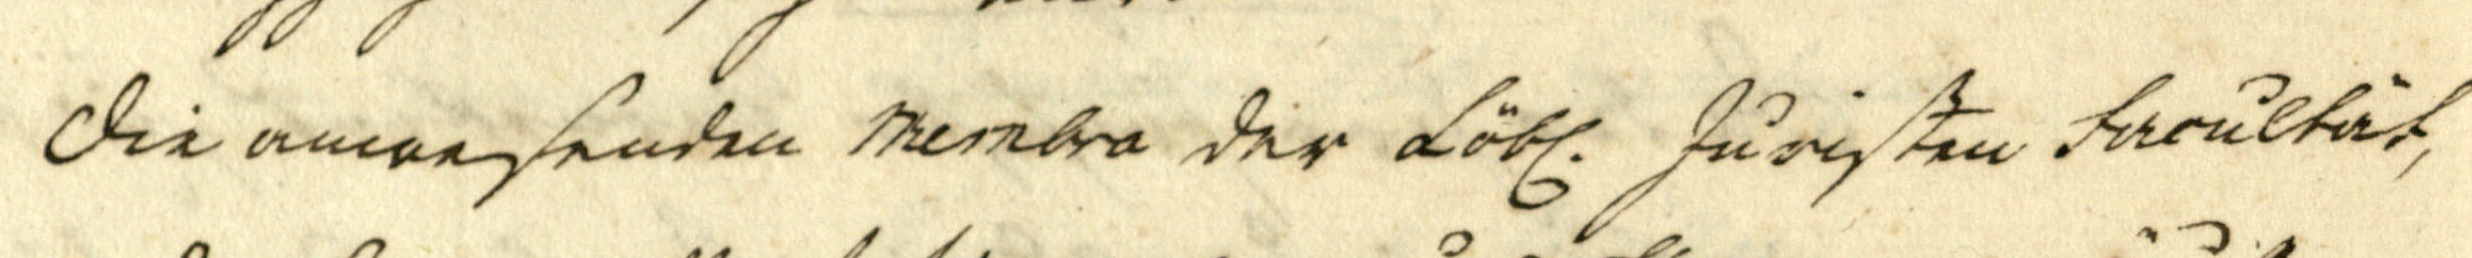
die anwesenden Membra der Löbl. Iuristen Facultät,
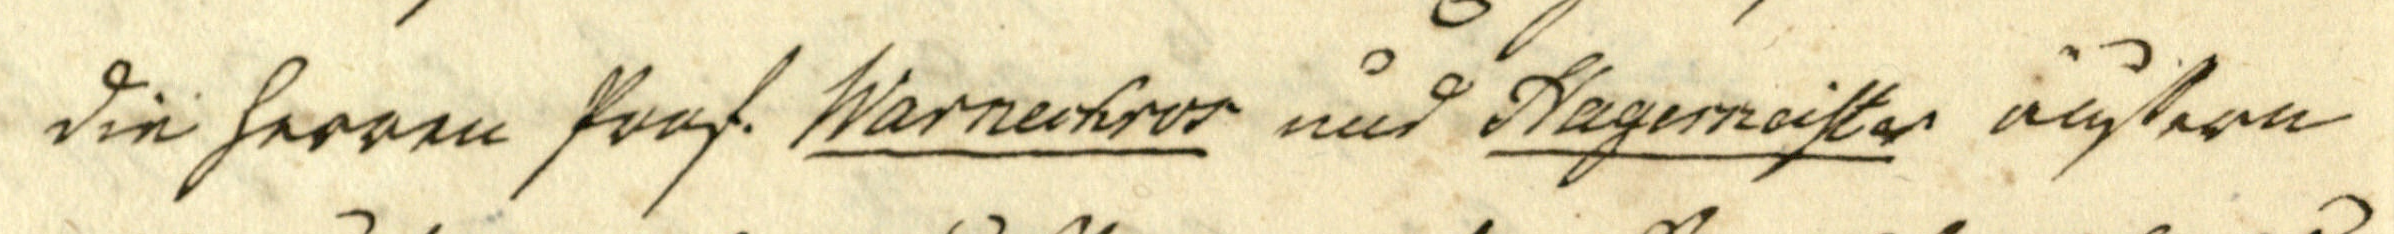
Die Herren Prof. Warneckros und Hagemeister äussern
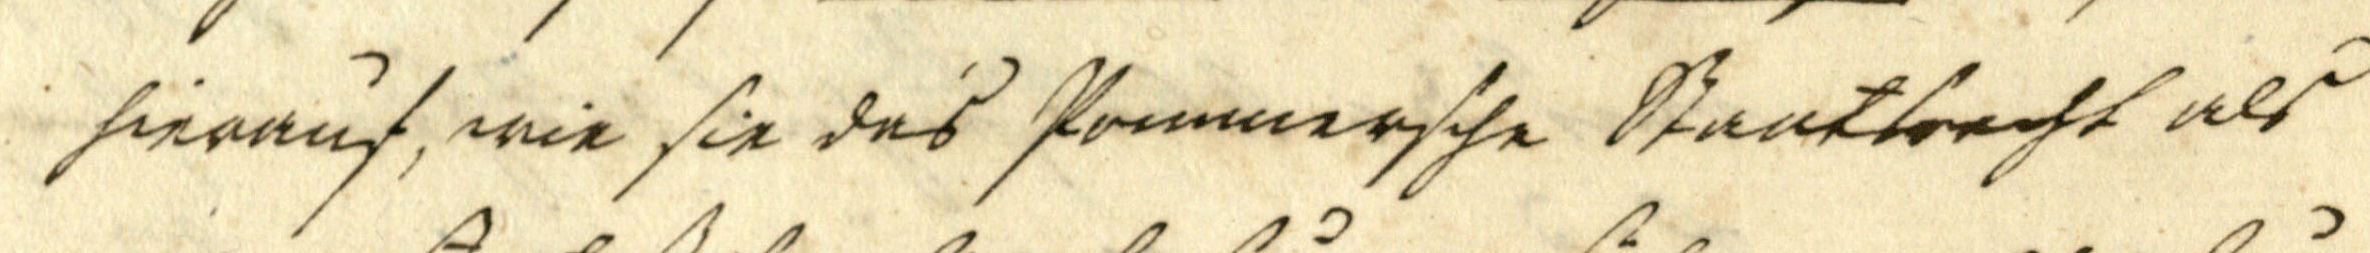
hierauf, wie sie das Pommersche Staatsrecht als
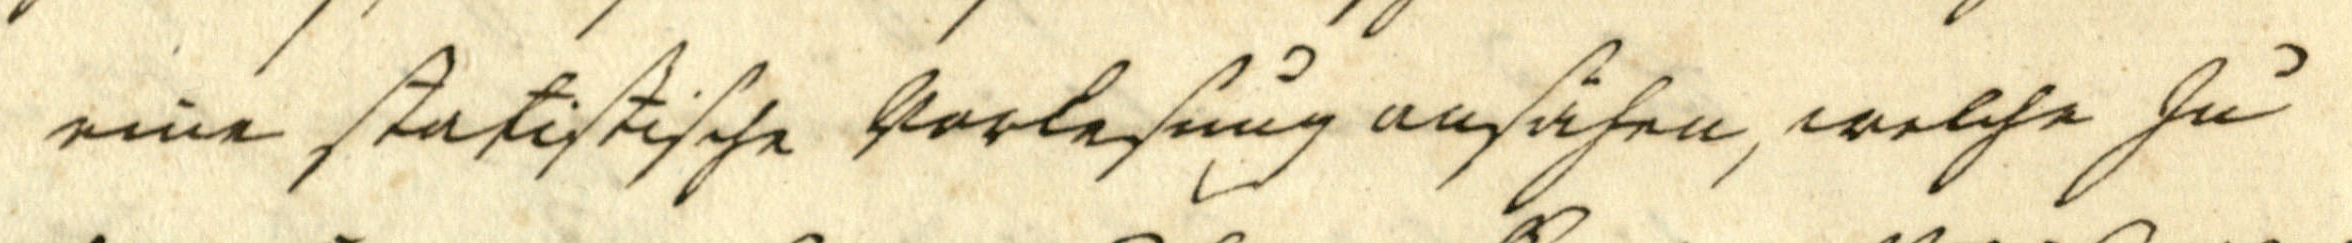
eine statistische Vorlesung ansähen, welche zu
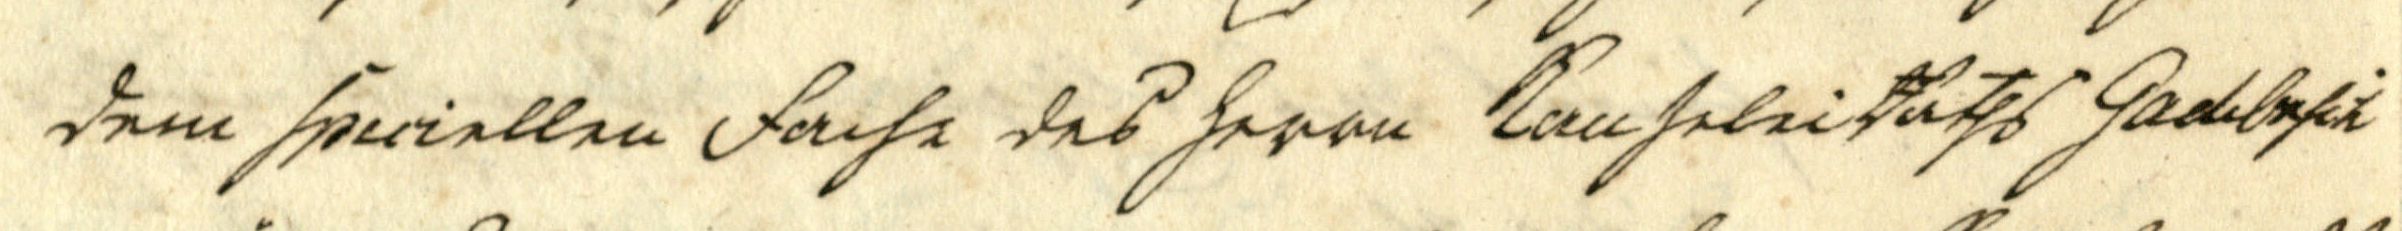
dem speciellen Fache des Herrn KanzeleiRaths Gadebusch
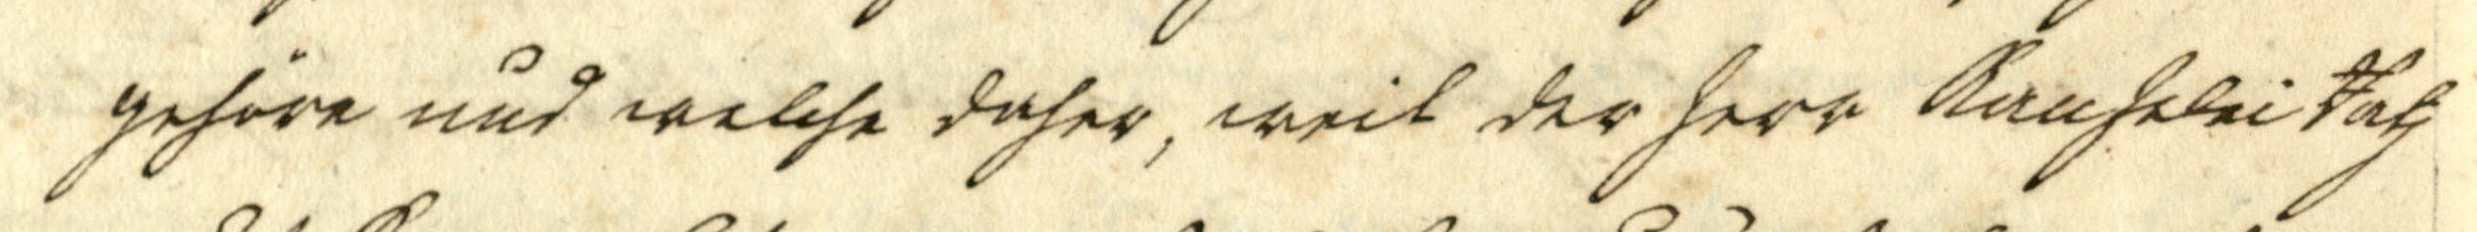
gehöre und welche daher, weil der Herr Kanzelei Rath
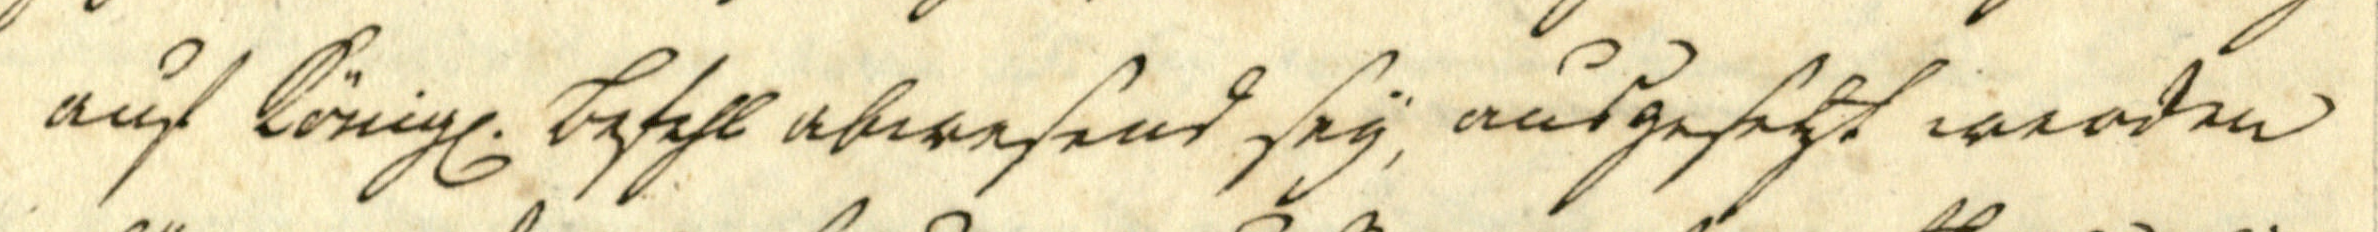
auf Königl. Befehl abwesend seÿ, ausgesetzt werden
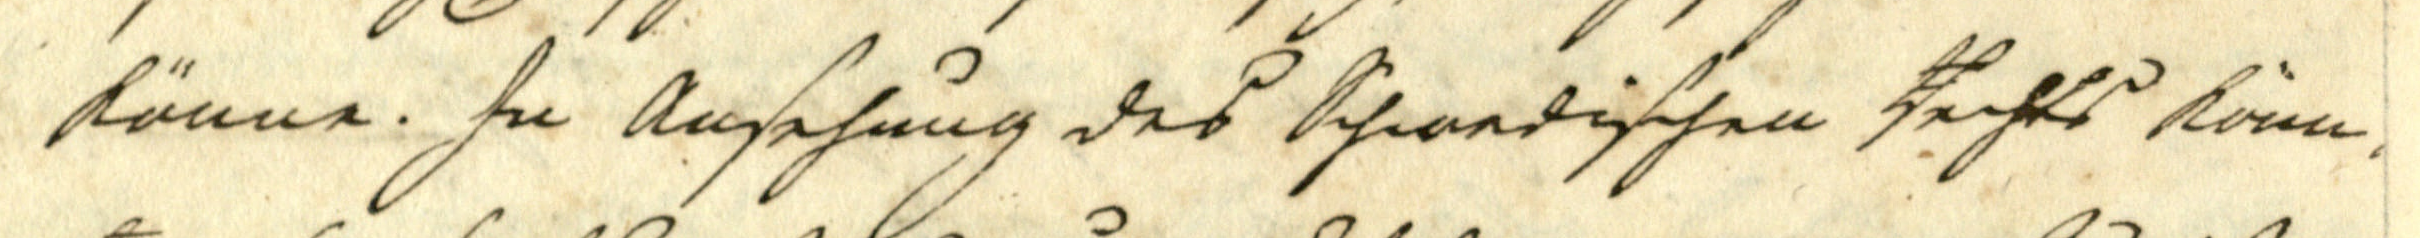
könne. In Ansehung des Schwedischen Rechts könn¬
